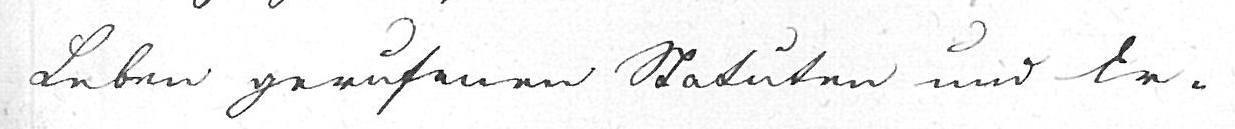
Leben gerufenen Statuten und er-
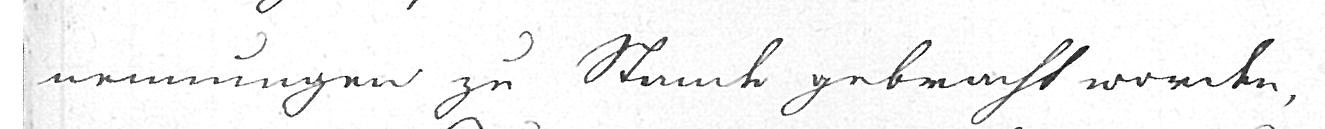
nennungen zu Stande gebracht worden,
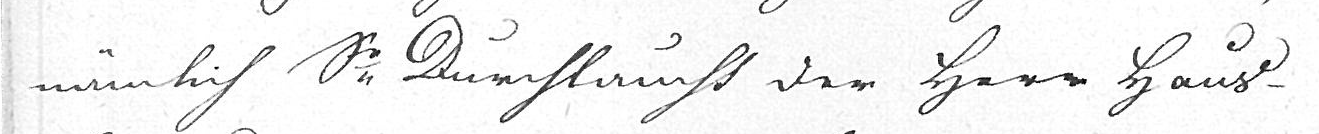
nämlich Sr. Duchrlaucht der Herr Haus,
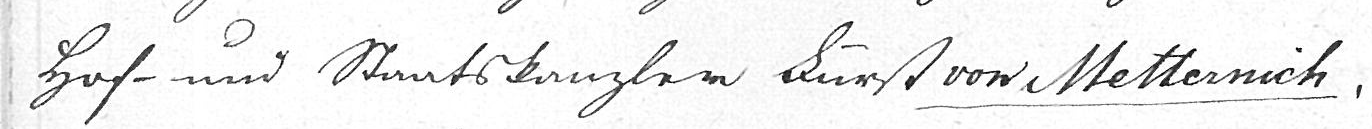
Hof- und Staatskanzler Fürst von Metternich,
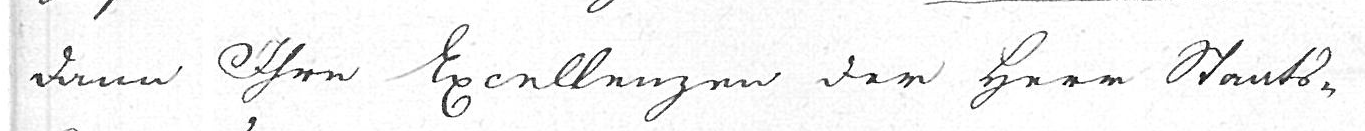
dann Ihre Excellenzen der Herr Staats-
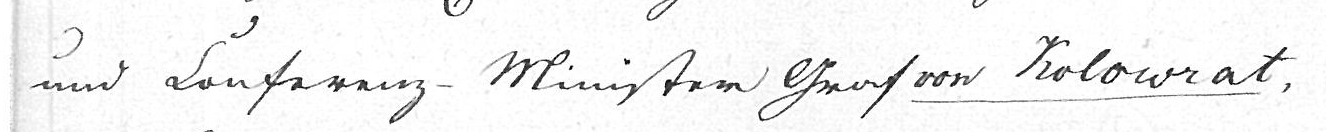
und Conferenz-Minister Graf von Klowrat,
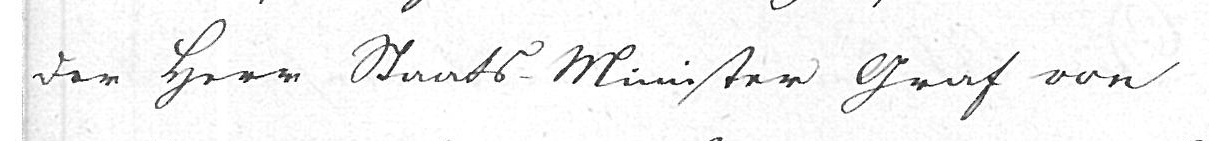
der Herr Staats-Minister Graf von
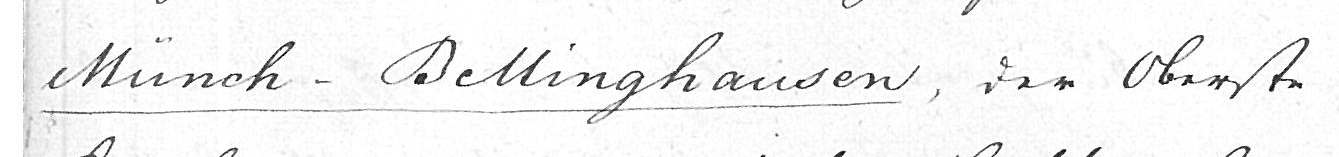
Münch-Bellinghausen, der Oberste
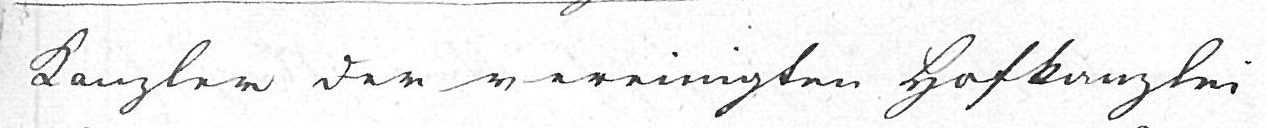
Kanzler der vereinigten Hofkanzlei
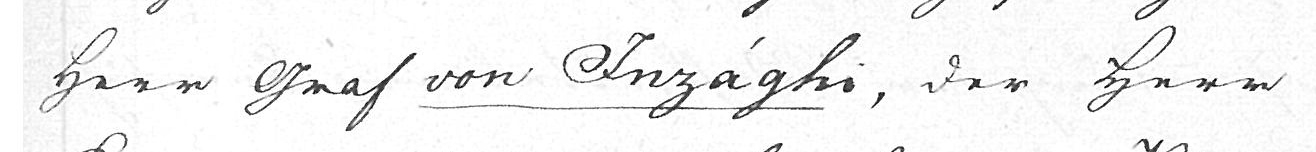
Herr Graf von Inzághi, der Herr
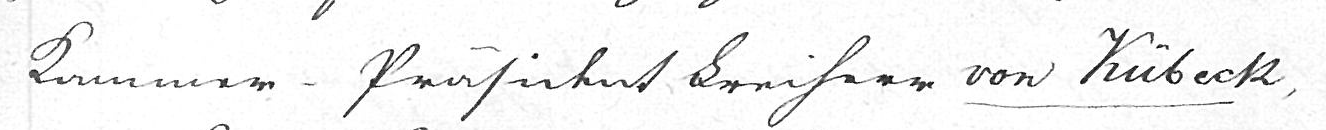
Kammer-Präsident Freiherr von Kübeck,
